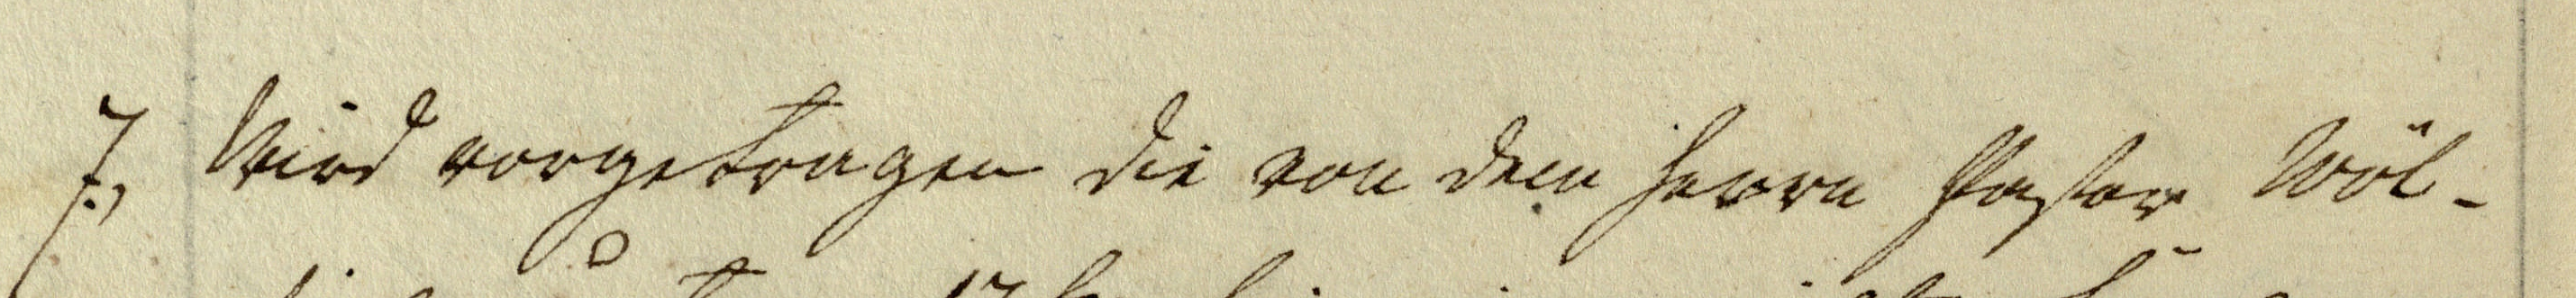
2. Wird vorgetragen die von dem Herrn Pastor Wöl¬
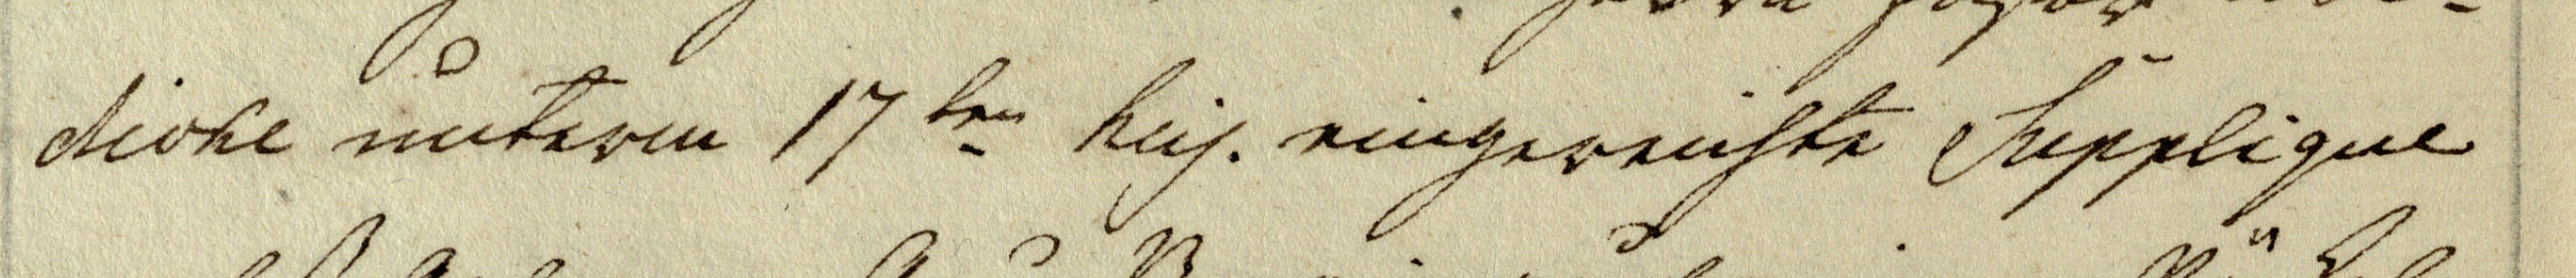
dicke unterm 17 ten huj. eingereichte Supplique
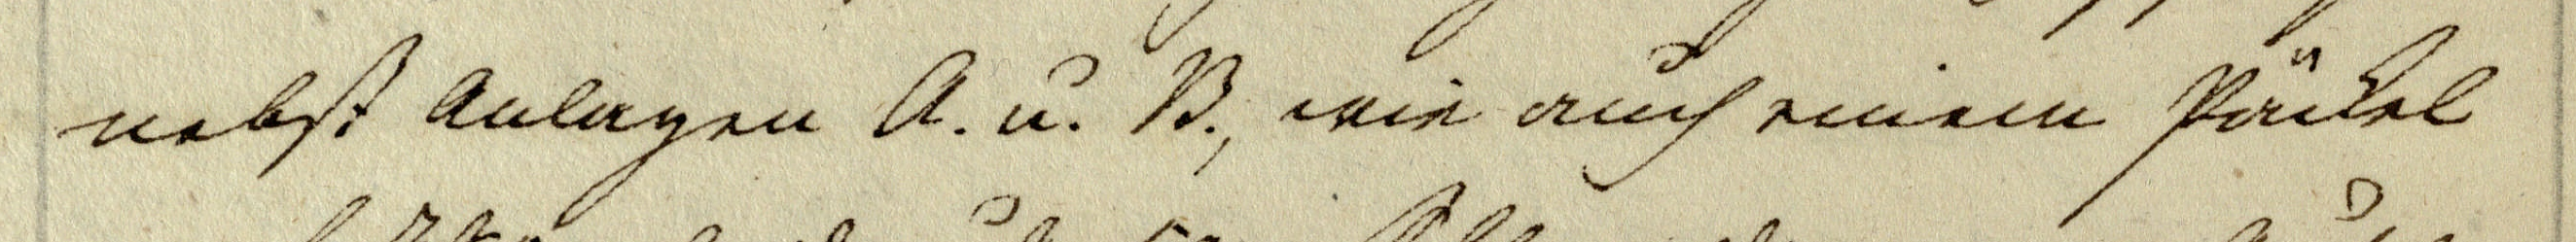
nebst Anlagen A. u. B., wie auch einem Päckel
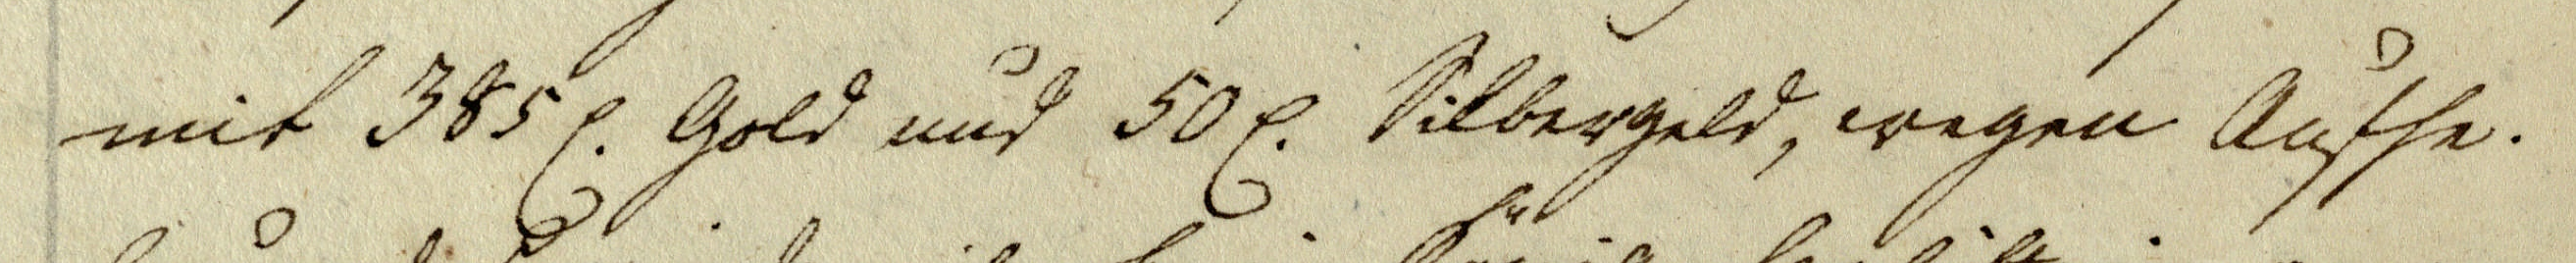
mit 385 l. Gold und 50 l. Silbergeld, wegen Aufhe¬
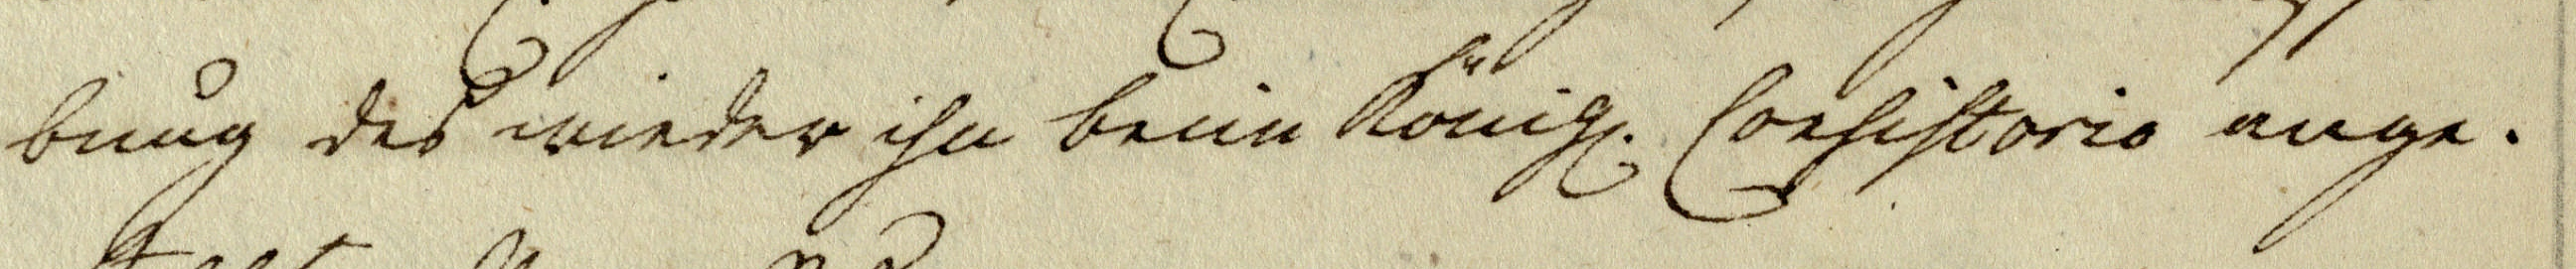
bung des wieder ihn beim Königl. Consistorio ange¬
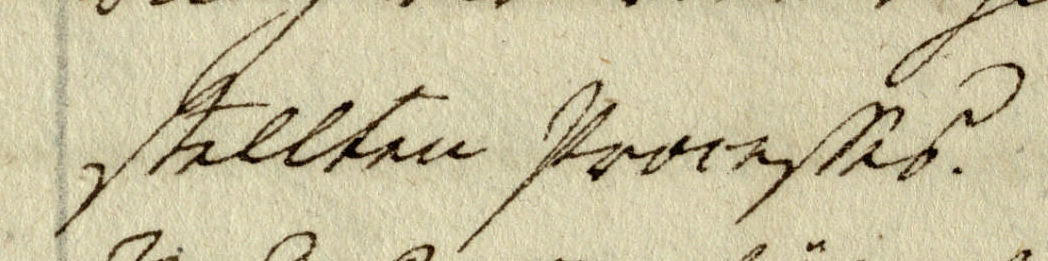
stellten Processes.
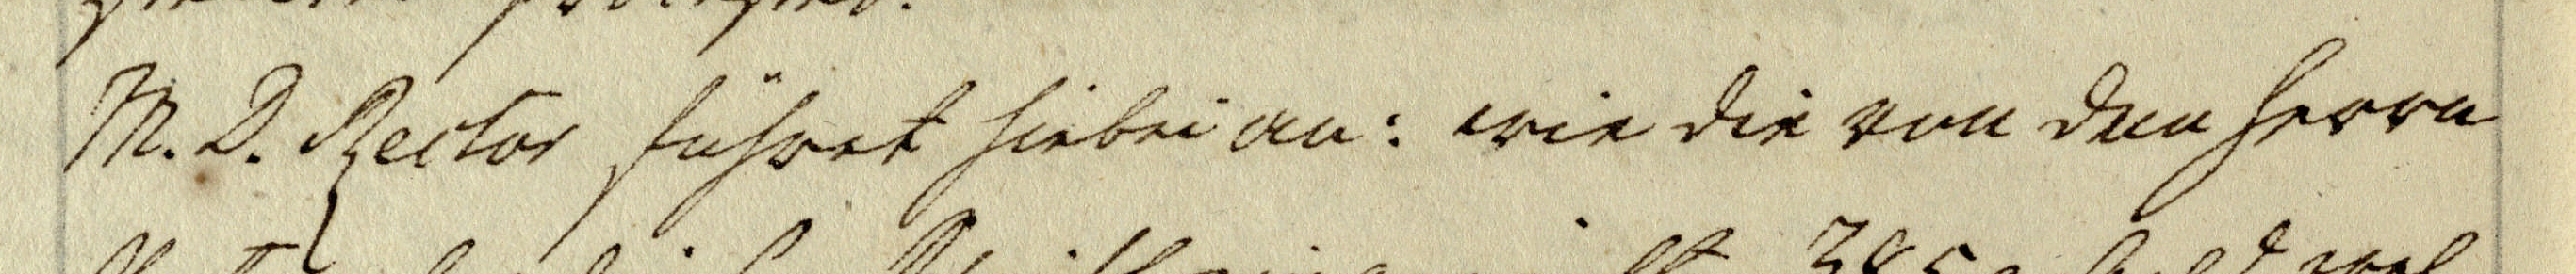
M. D. Rector führet hiebei an: wie die von dem Herrn
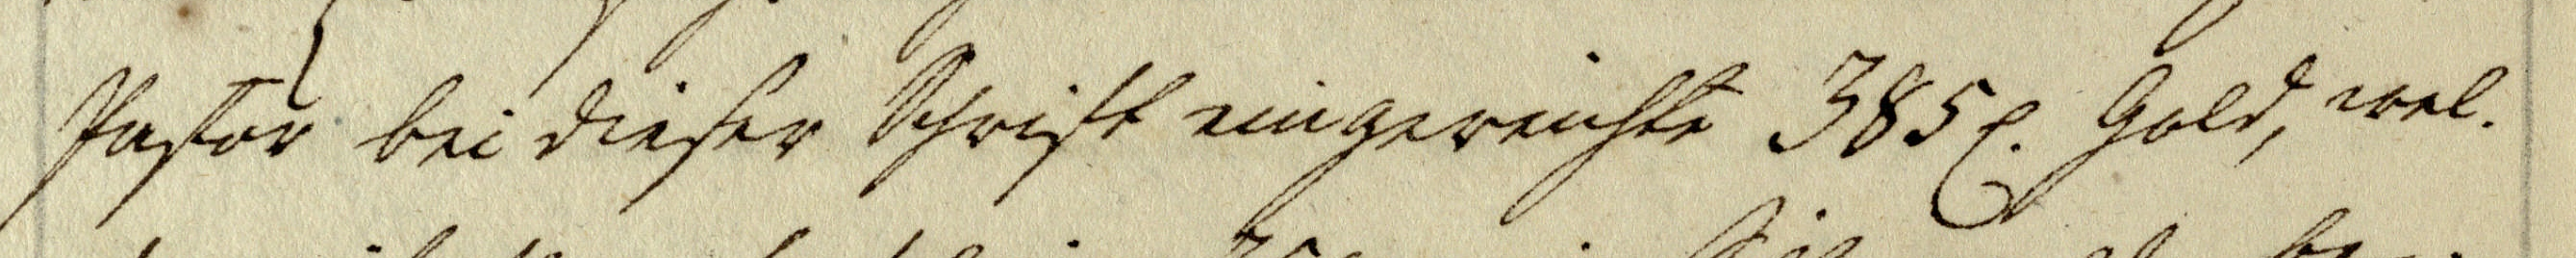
Pastor bei dieser Schrift eingereichte 385 l. Gold, wel¬
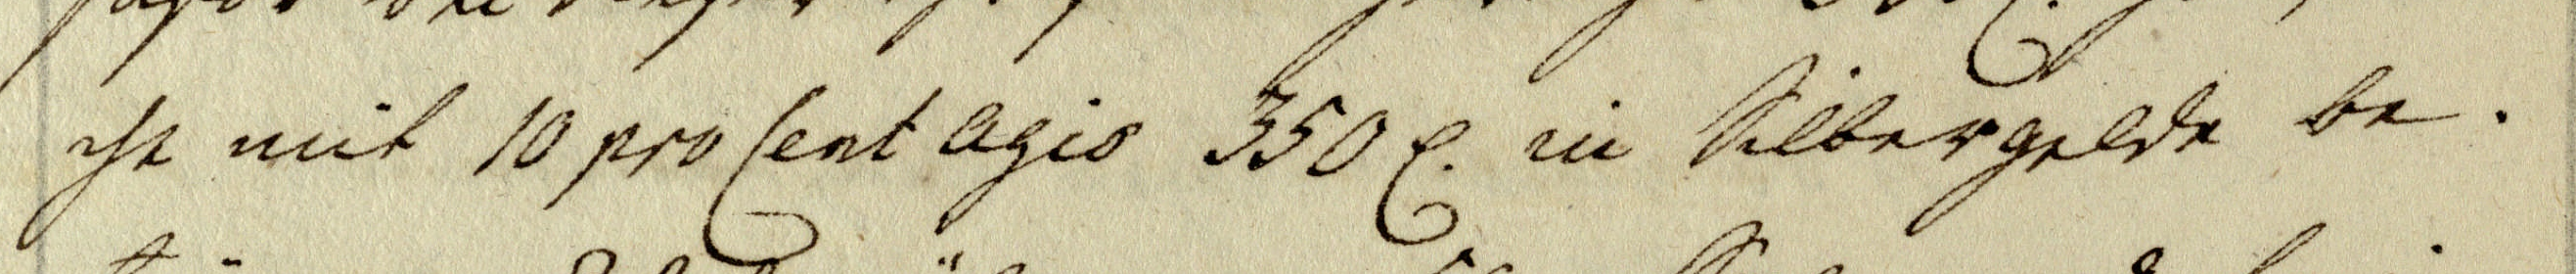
che mit 10 pro Cent Agio 350 l. in Silbergelde be¬
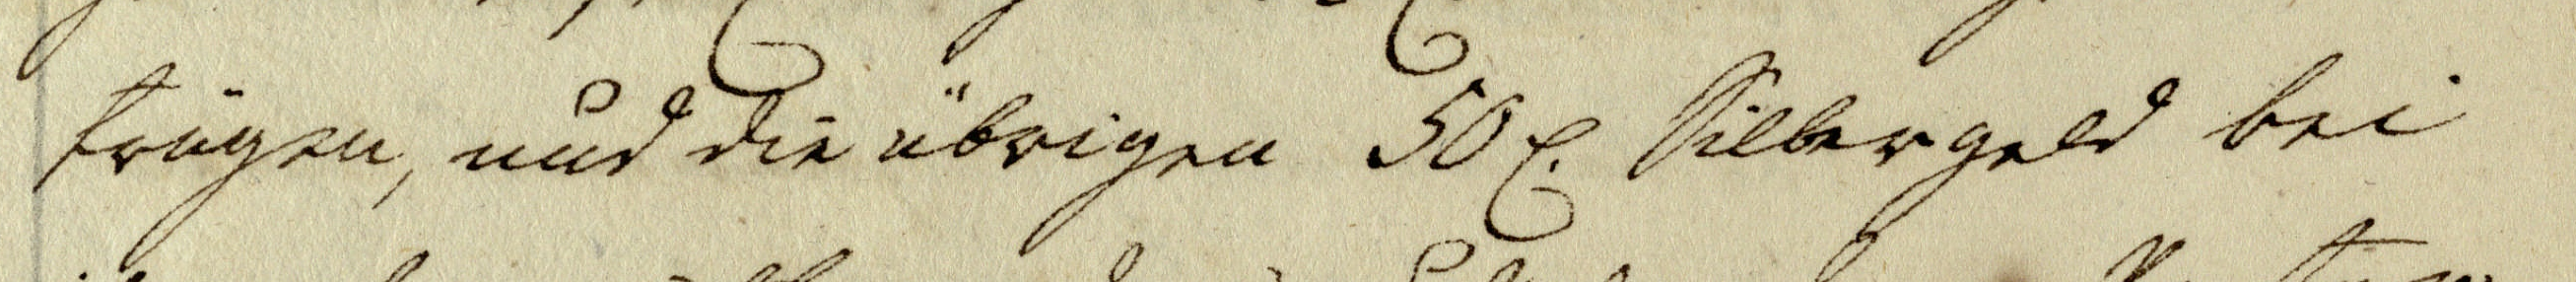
trügen, und die übrigen 50 l. Silbergeld bei
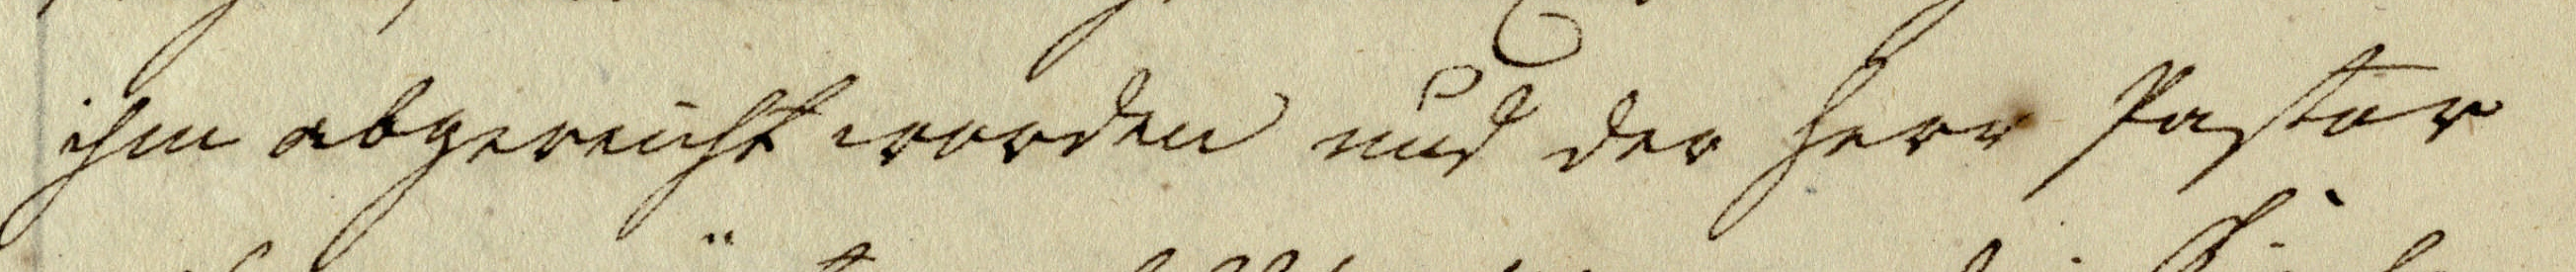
ihm abgereicht worden und der Herr Pastor
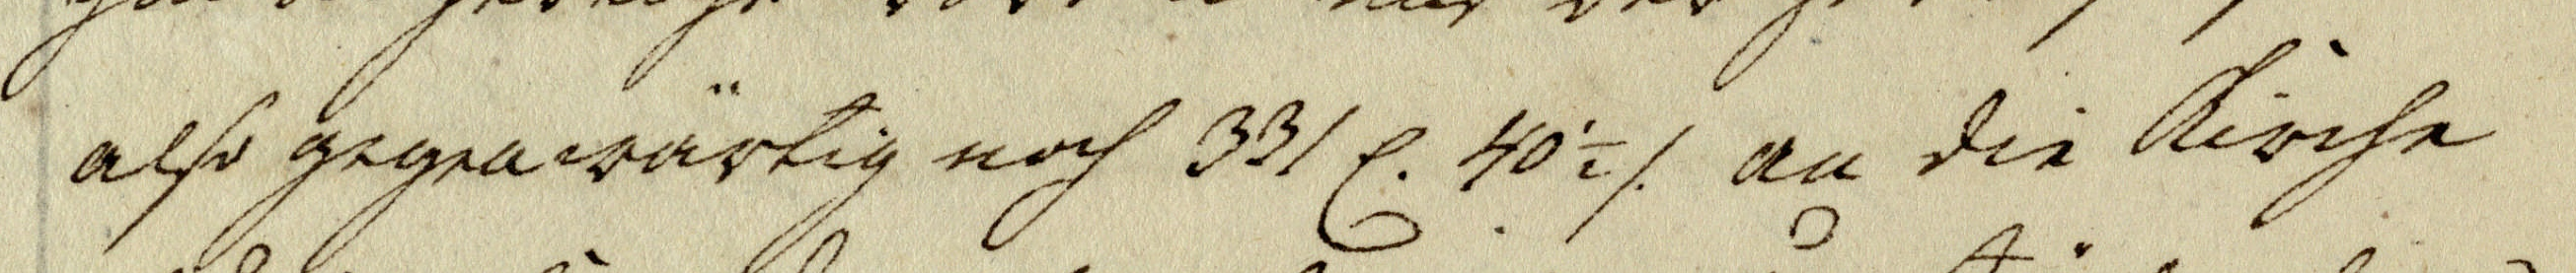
also gegenwärtig noch 331 l. 40 ½ s. an die Kirche
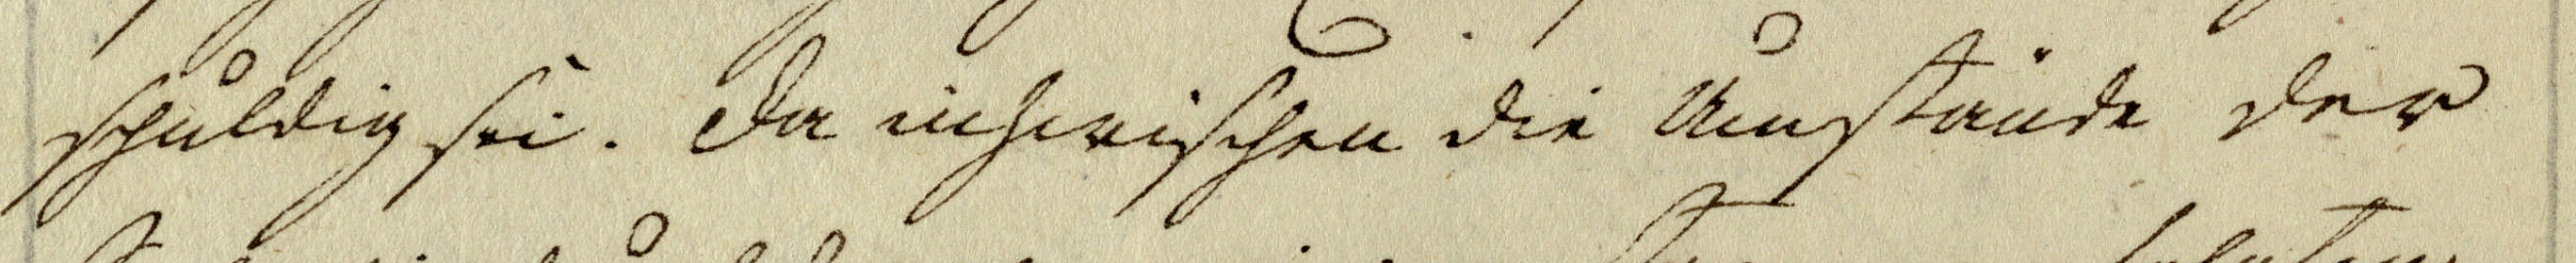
schuldig sei. Da inzwischen die Umstände der
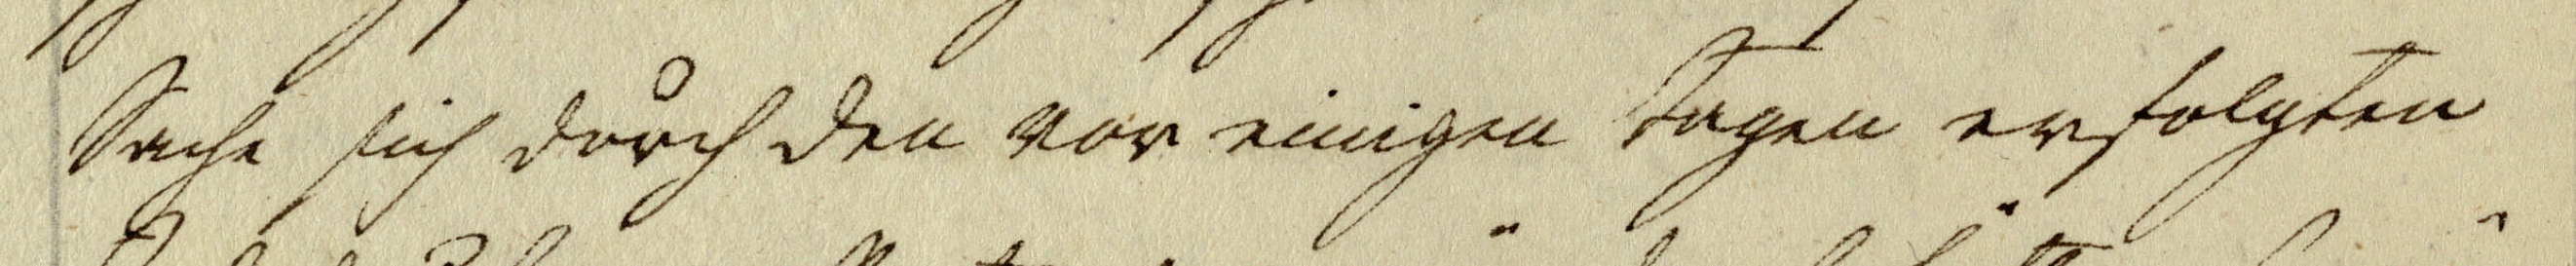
Sache sich durch den vor einigen Tagen erfolgten
